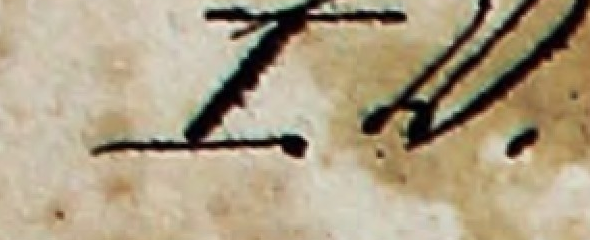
I.V.
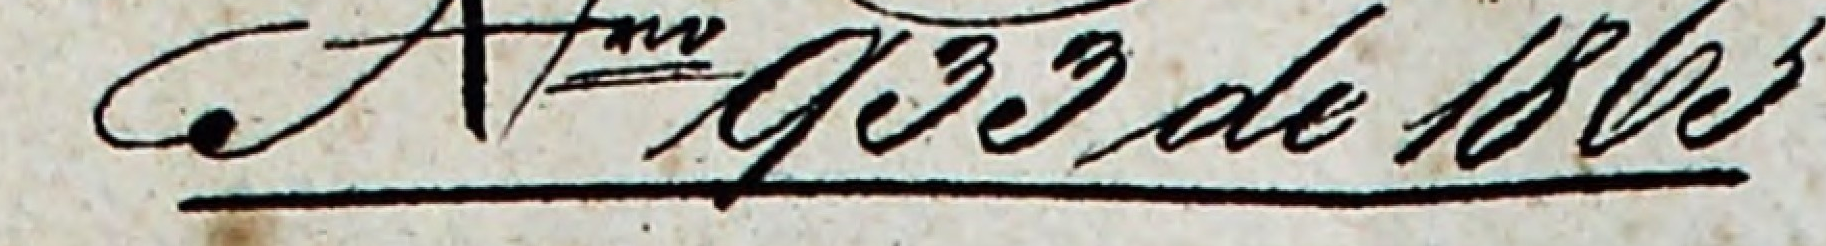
Nro 933 de 1865
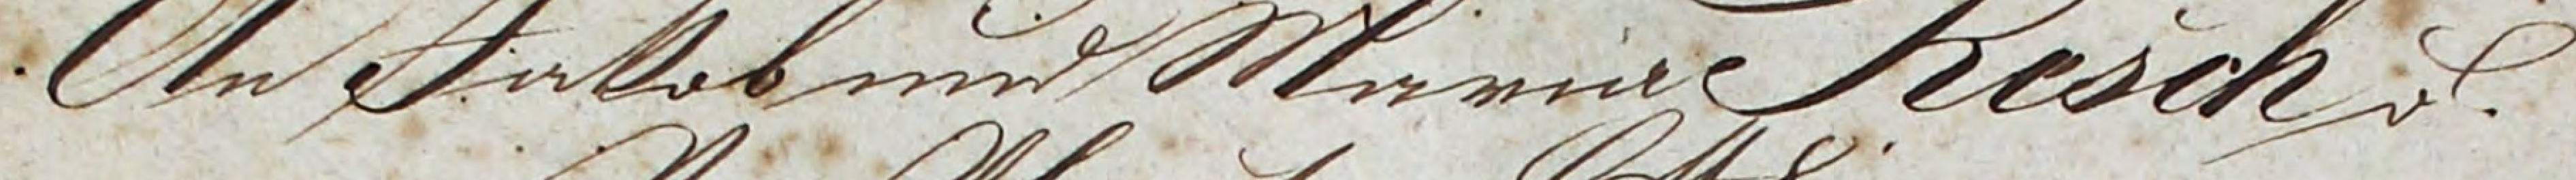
An Jakob und Maria Resch ab
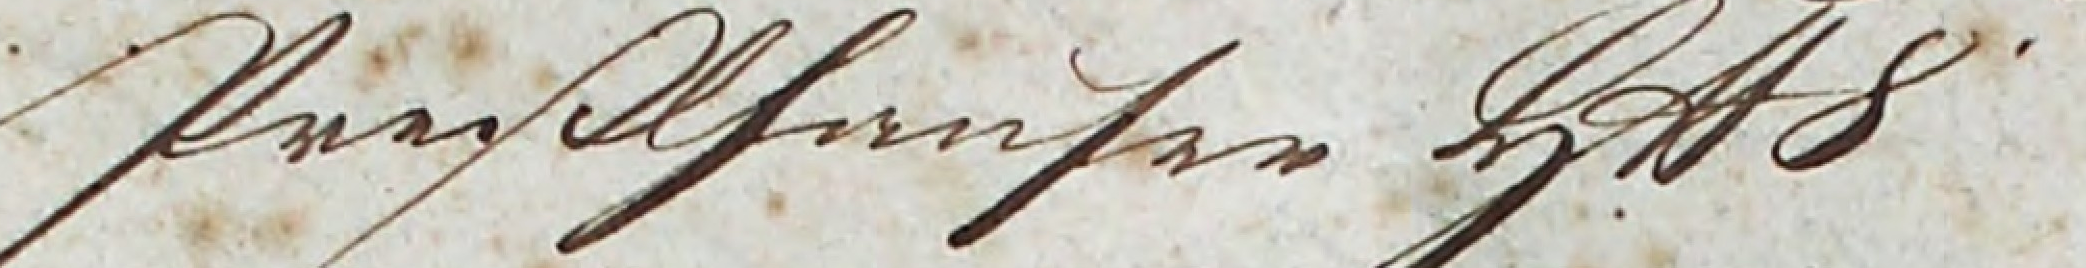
Preßlhauser Hn 8
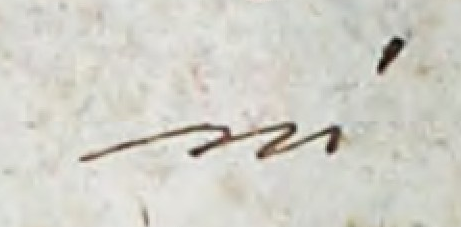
in
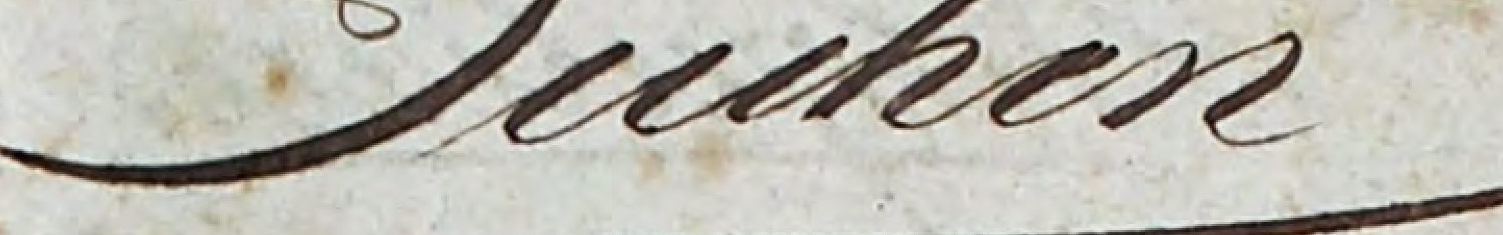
Puchen
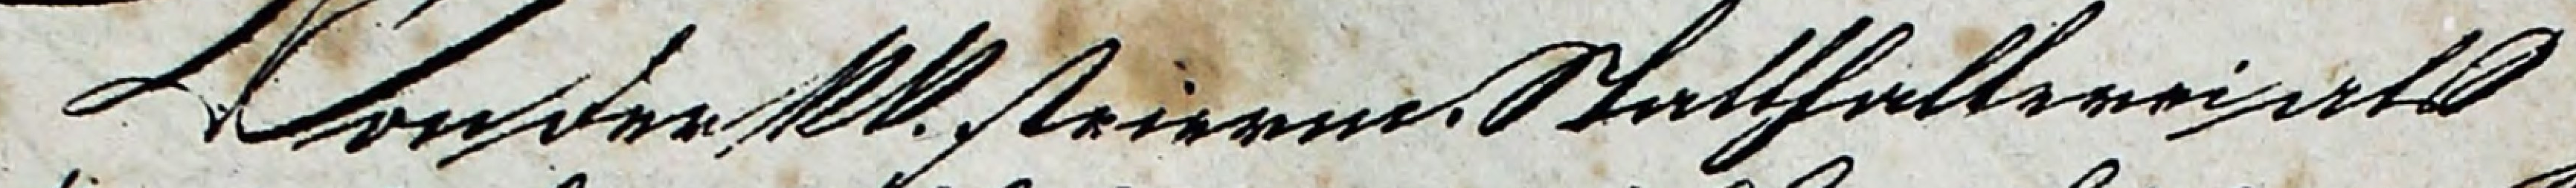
Von der kk. steierm. Statthalterei als
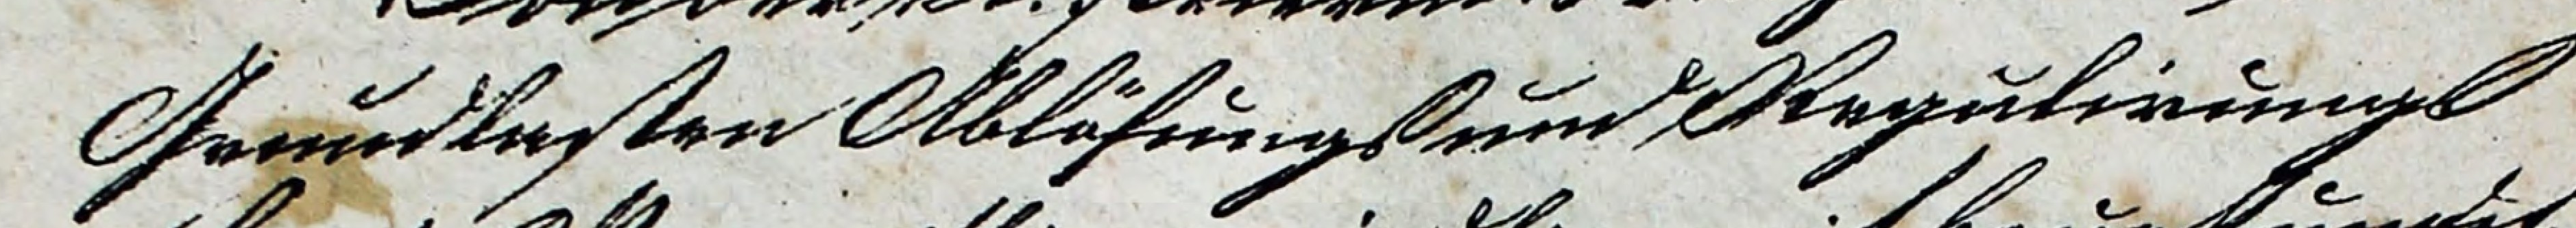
Grundlasten Ablösung und Regulirungs
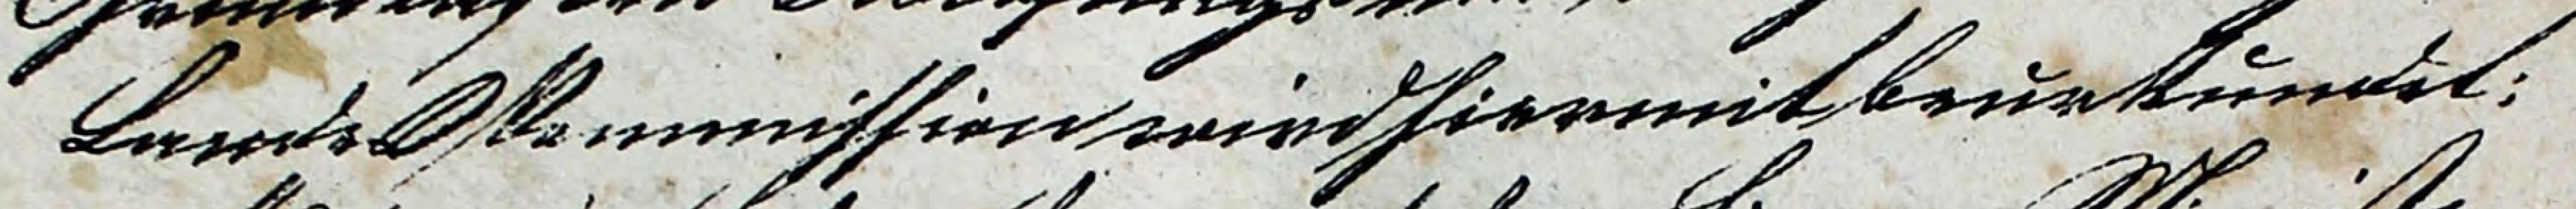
Landeskommission wird hiermit beurkundet:
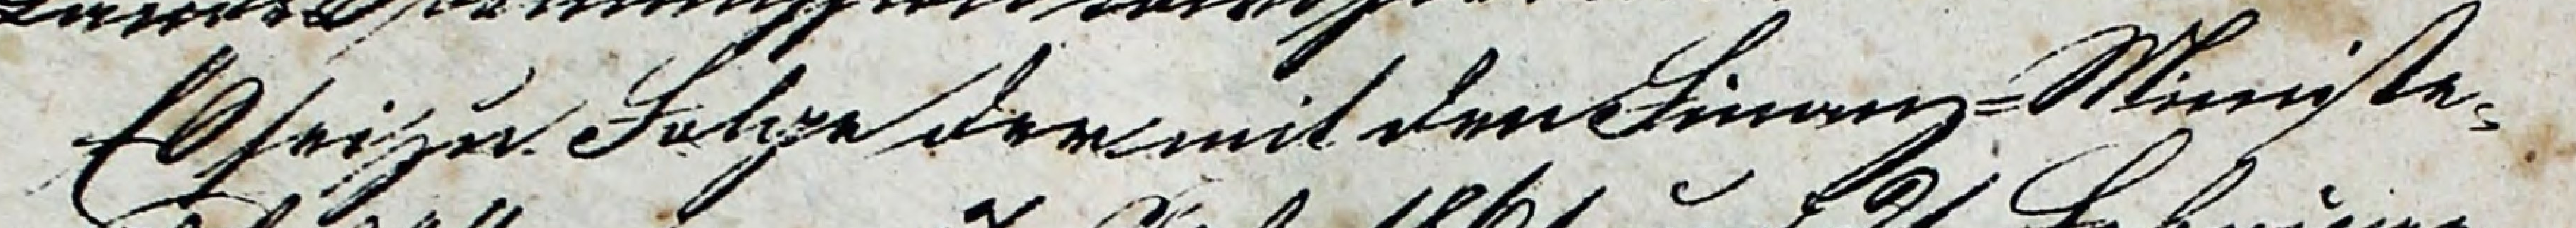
Es sei zu Folge der mit den Finanz=Ministe„
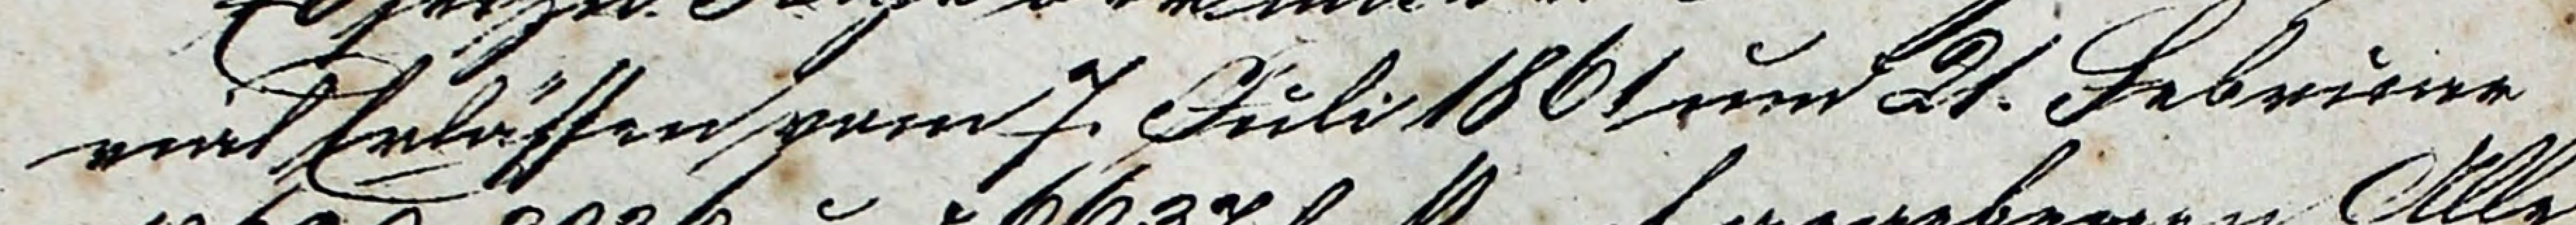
rial Erlässen vom 7. Juli 1861 und 21. Februar
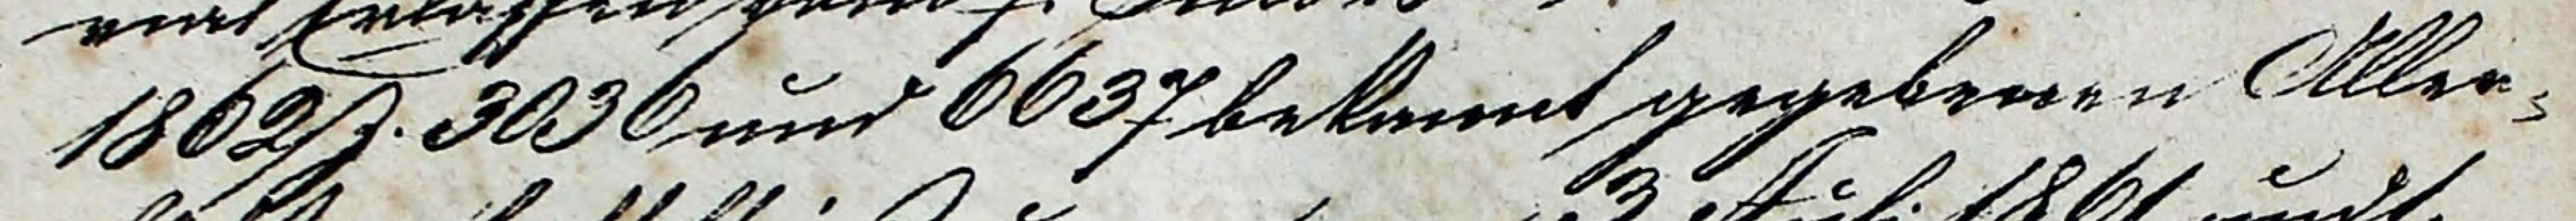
1862 Z. 303 und 6637 bekannt gegebenen Aller„
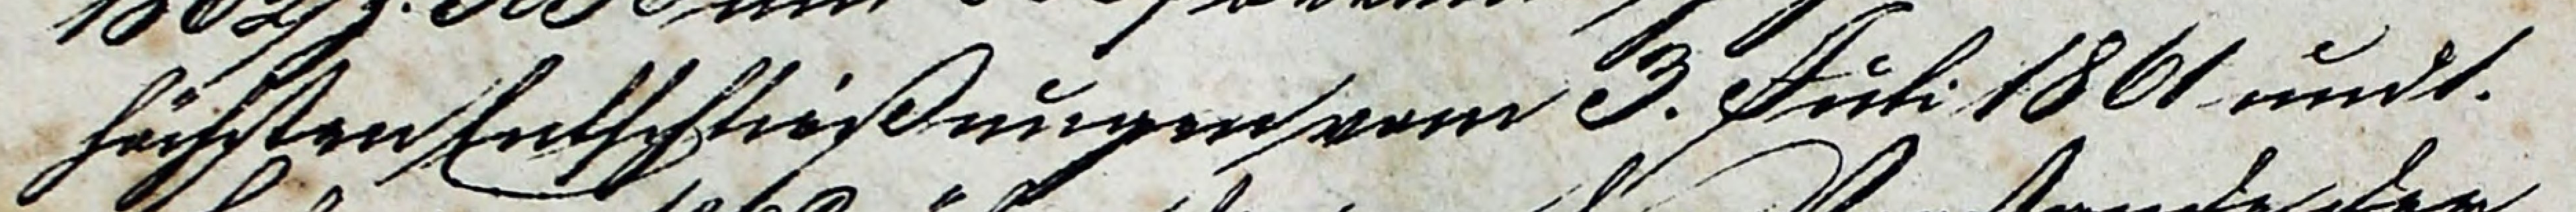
höchsten Entschtießungen vom 3. Juli 1861 und 1.
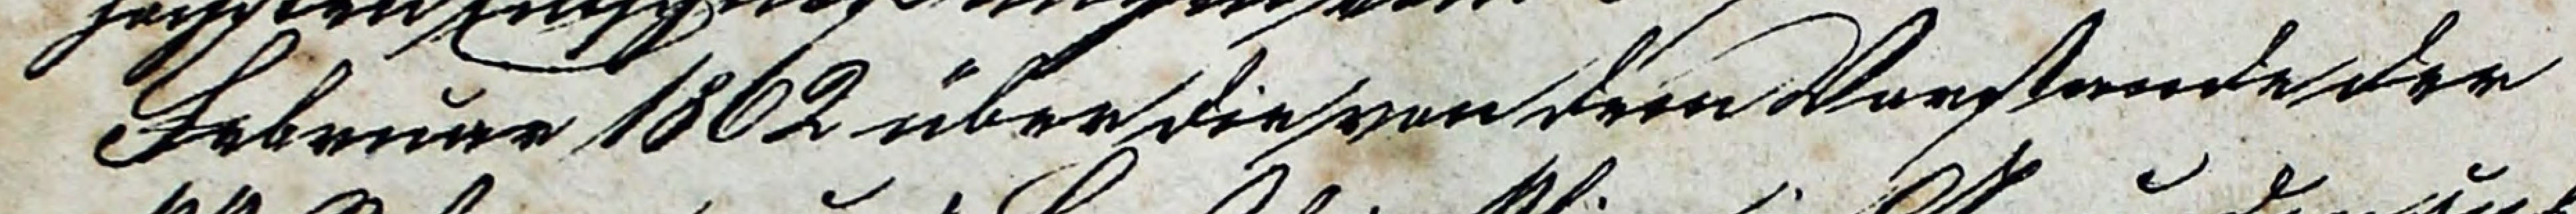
Februar 1862 über die von dem Vorstande der
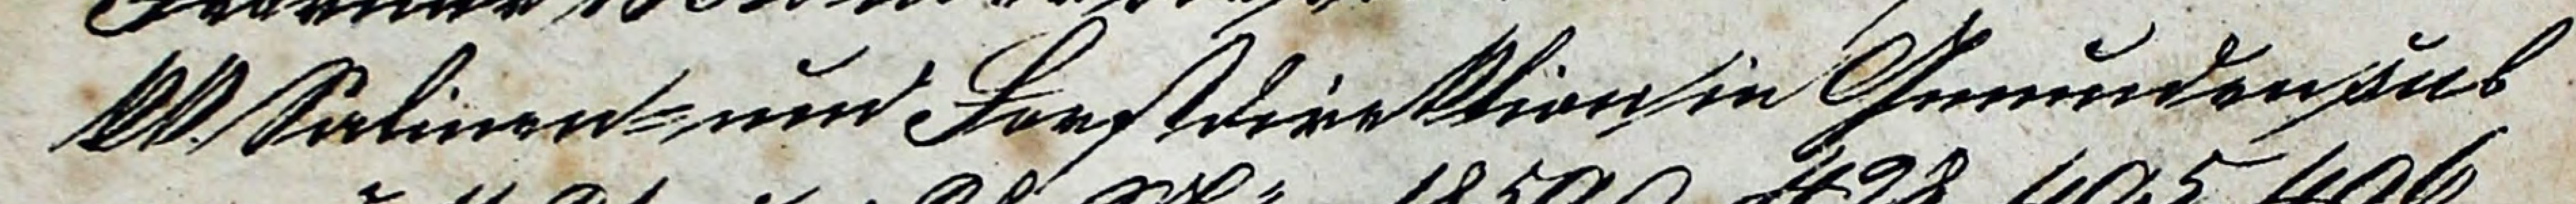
kk. Salinen= und Forstdirektion in Gmunden aus
